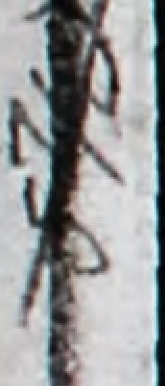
8??
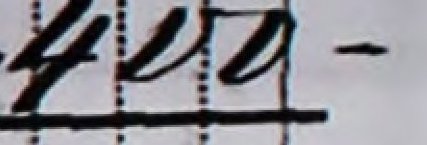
400 –
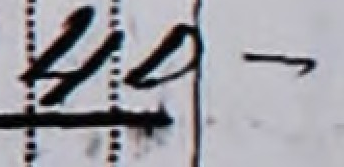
40 –
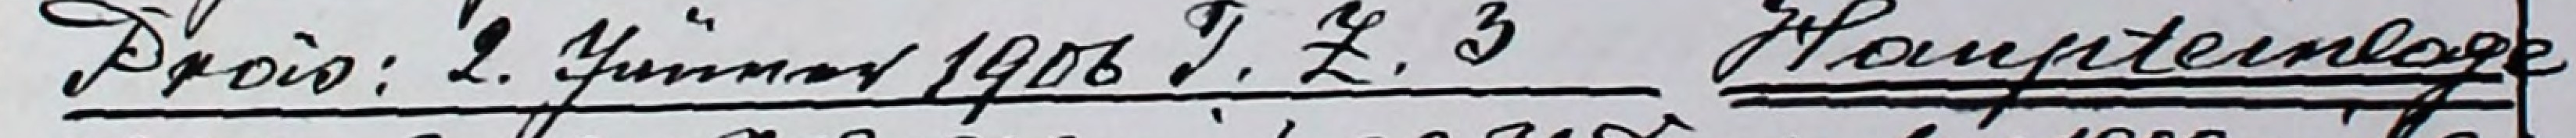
Präs: 2. Jänner 1906 T.Z. 3 Haupteinlage
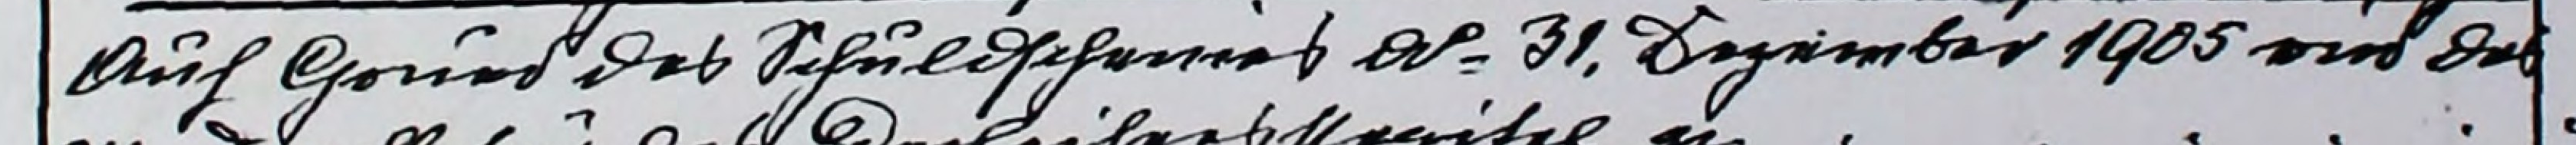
Auf Grund des Schuldscheines ddo 31. Dezember 1905 wird das
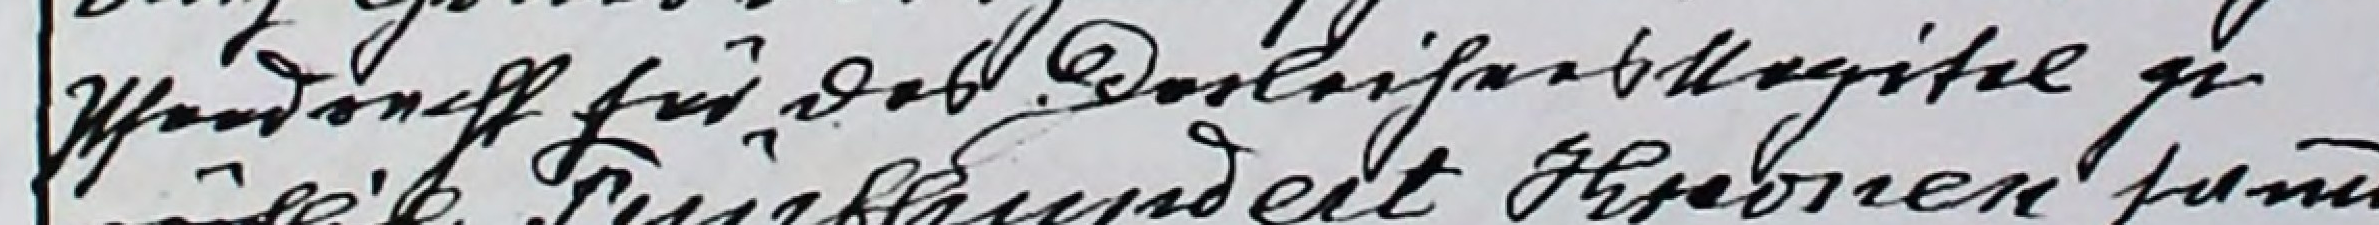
Pfandrecht für des Darleihenskapital pr
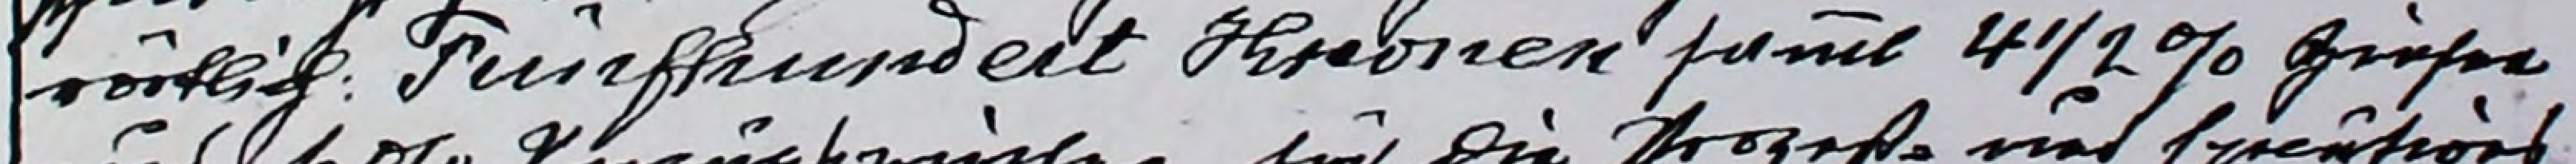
wörtlich: Fünfhundert Kronen sammt 4 1/2 % Zinsen
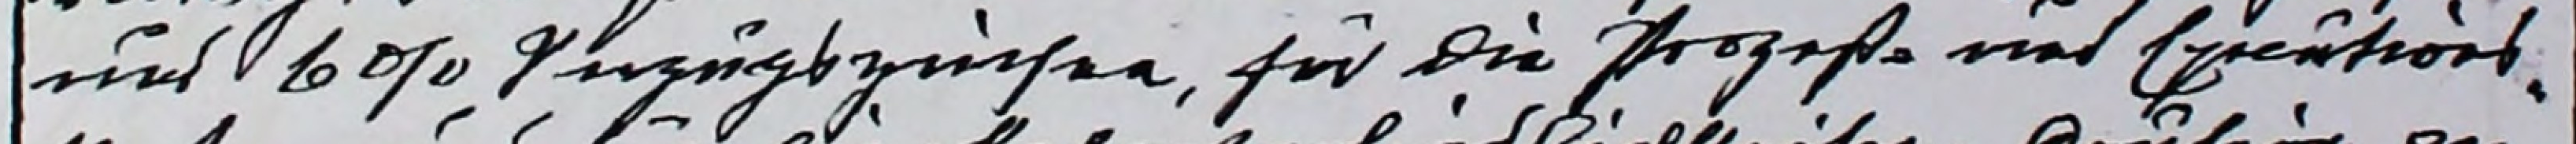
und 6 % Verzugszinsen, für die Prozest= und Executions„
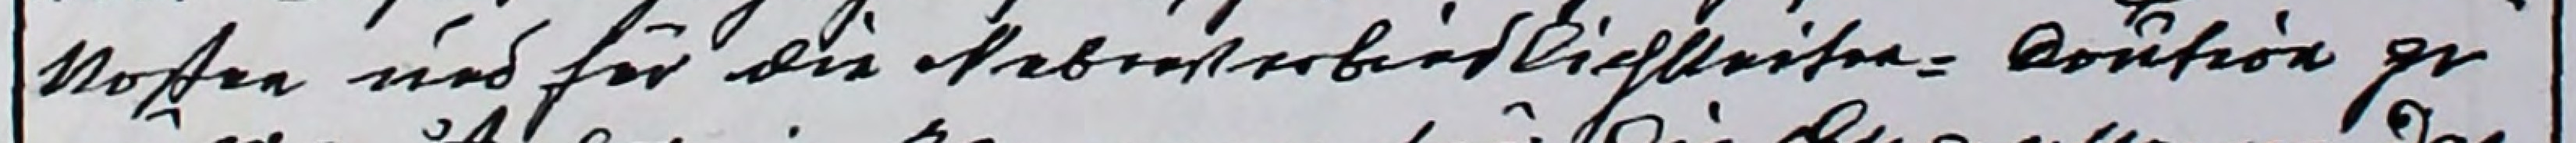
kosten und für die Nebenverbindlichkeiten= Caution pr
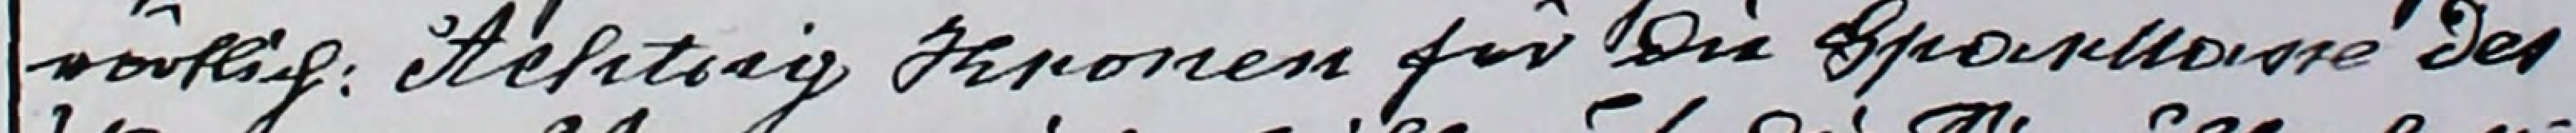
wörtlich: Achtzig Kronen für die Sparkasse des
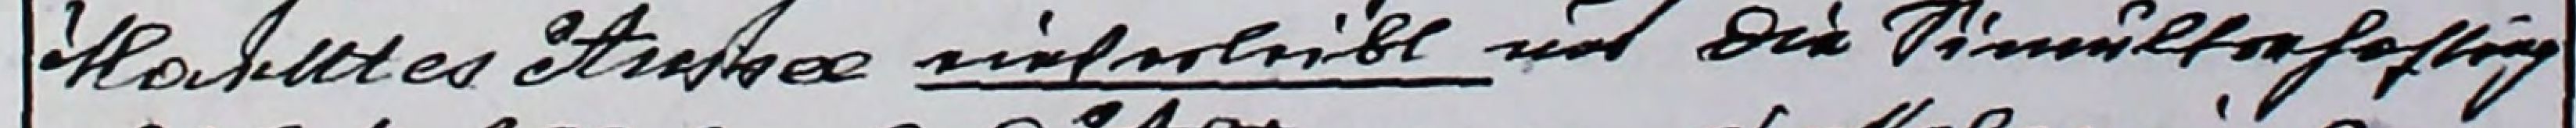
Marktes Aussee einverleibt und die Simultanhaftung
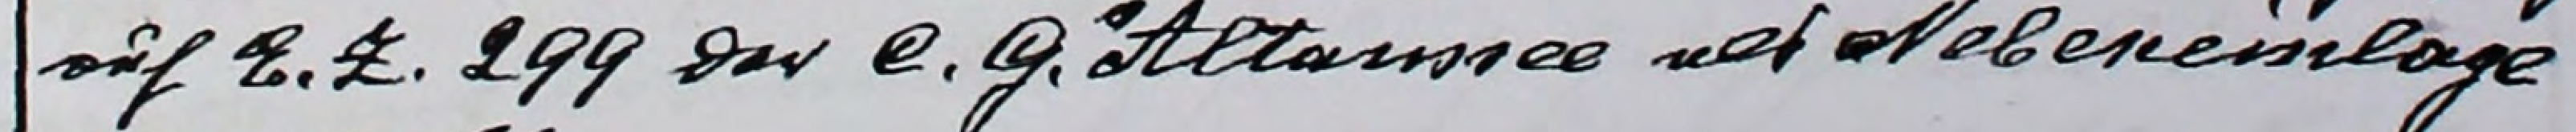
auf E.Z. 299 der C.G. Altaussee als Nebeneinlage
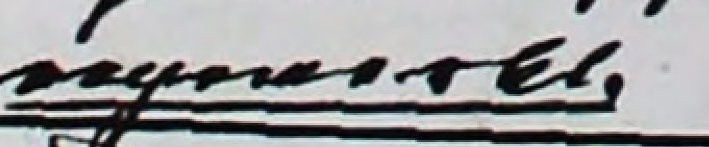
angemerkt.
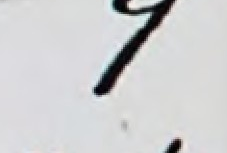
9
